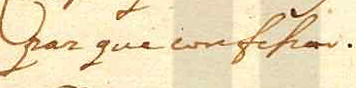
pas que confessar.
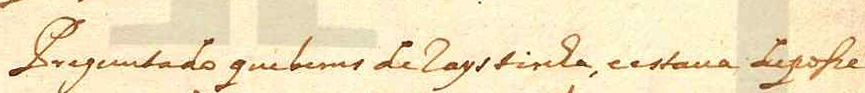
Preguntado que bems de Rays tinha, e estaua de posse
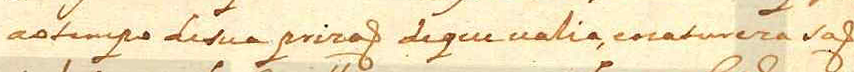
ao tempo de sua prizaõ de que ualia, e natureza saõ
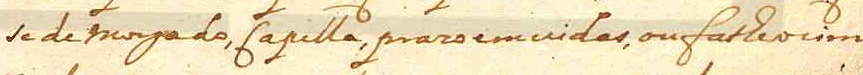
se de morgado, Capella, prazo em uidas, ou fatheosim
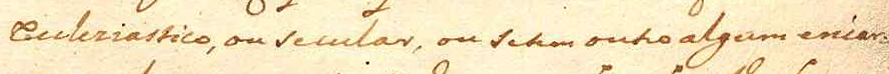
Eccleziastico, ou secular, ou se tem outro algum encar
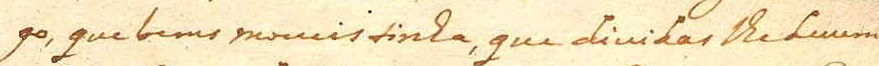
go, que bems moueis tinha, que diuidas lhe deuem
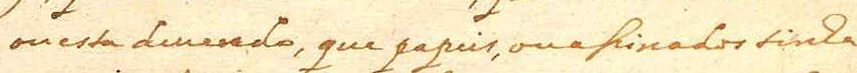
ou esta deuendo, que papeis, ou assinados tinha
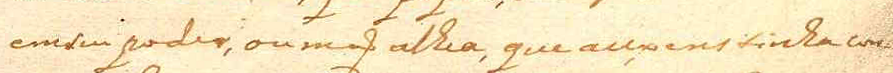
em seu poder, ou maõ alhea, que acçoens tinha con
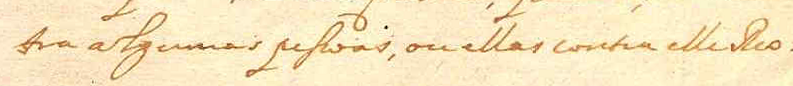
tra algumas pessoas, ou ellas contra elle Reo.
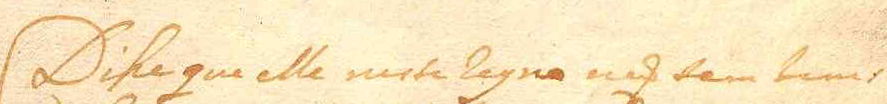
Disse que elle neste Reyno naõ tem bems
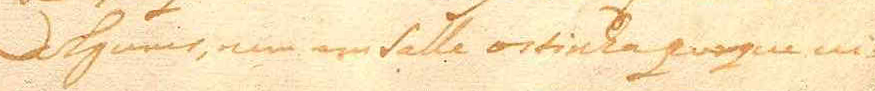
algums, nem em salle os tinha porque ui
